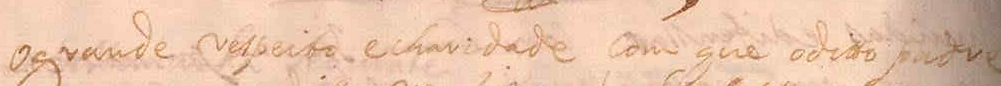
o grande respeito, e charidade, com que o ditto padre
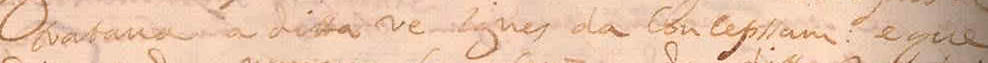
trataua a ditta re Ignes da Concepssam: e que
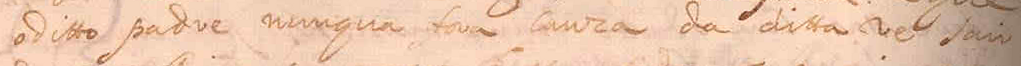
o ditto padre nunqua fora cauza da ditta re sair
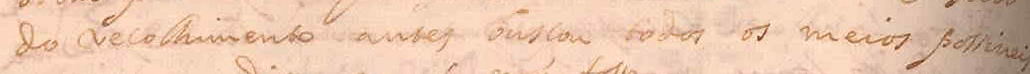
do recolhimento antes buscou todos os meios possiueis
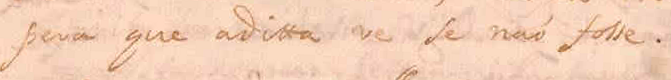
pera que a ditta re se naõ fosse.
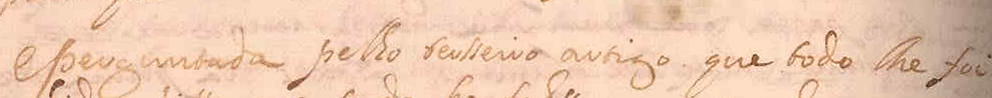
e perguntada pello tersseiro artigo que todo lhe foi
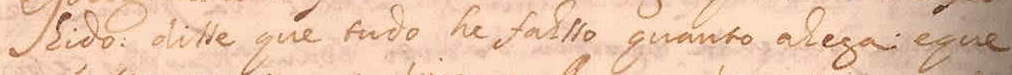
lido disse que tudo he falsso quanto alega; e que
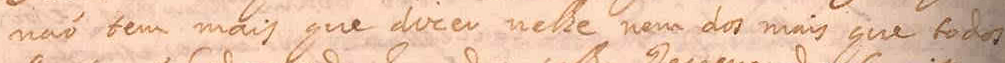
naõ tem mais que dizer nelle nem dos mais que todos
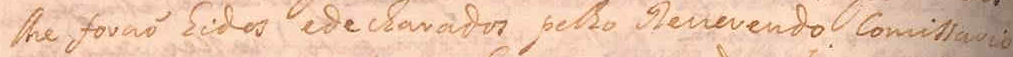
lhe foraõ lidos e declarados pello Reuerendo Comissario
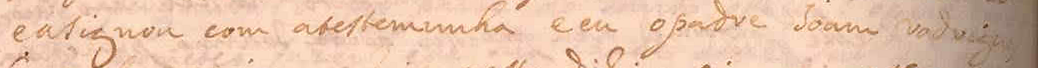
e asignou com a testemunha e eu o padre Ioam rodrigues
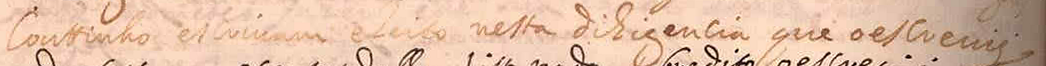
Couttinho escriuam eleito nesta diligencia que o escreuy
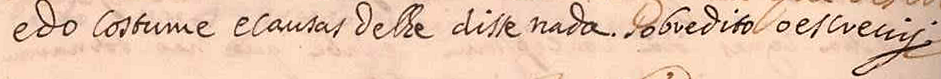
e do costume e causas delle disse nada. sobredito o escreuy
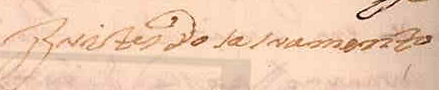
Brites do sacramento
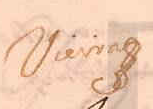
Vieira
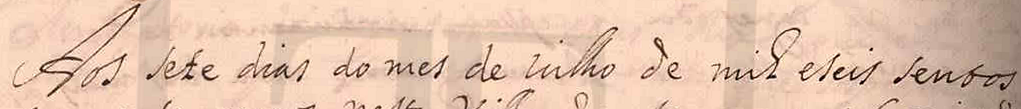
Aos sete dias do mes de Iulho de mil e seissentos
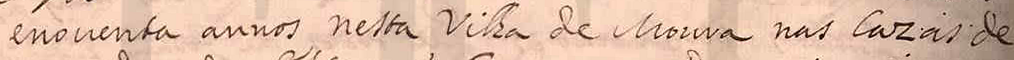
e nouenta annos nesta Villa de Moura nas cazas de
